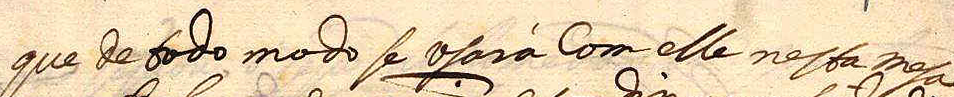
que de todo modo se vsará com elle nesta mesa
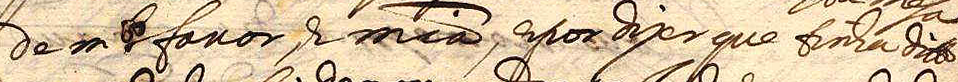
de mto fauor, E mīa, E por dizer que tinha ditto
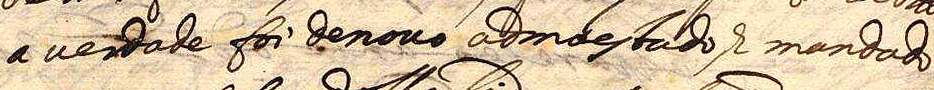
a uerdade foi de nouo admoestado, E mandado
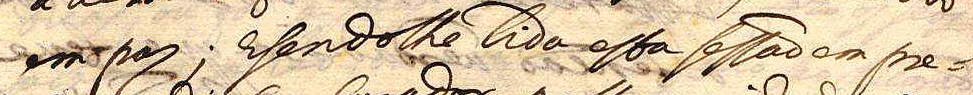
em paz; E sendolhe lida esta sessão em pre
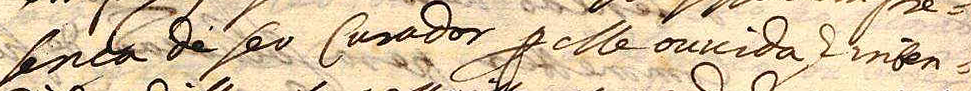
sença de seo Curador ꝑ elle ouuida e inten
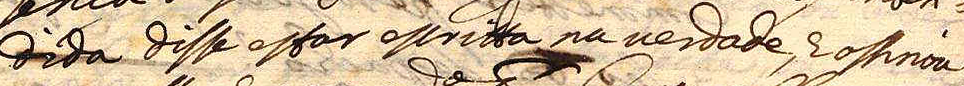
dida disse estar escritta na uerdade, E assinou
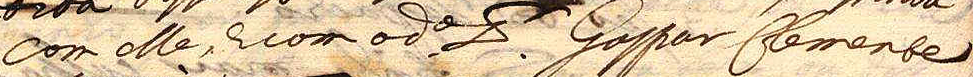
com elle, E com o d.o sr. Gaspar Clemente
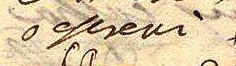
o escreui
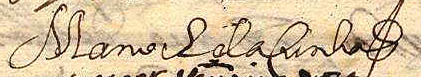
Manoel da Cunha
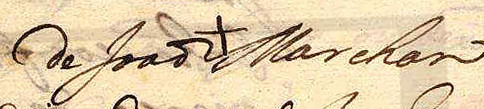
de Joaõ Marchan
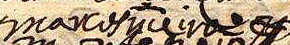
Marcos uieira
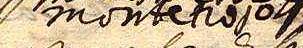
monteRojo
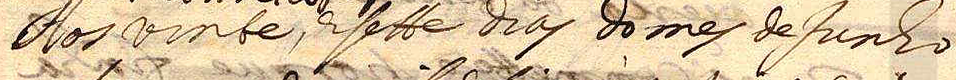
Aos vinte, E sette dias do mes de Junho
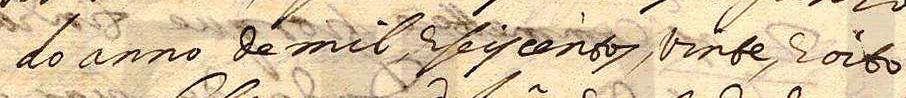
do anno de mil E seiscentos, vinte, e oito
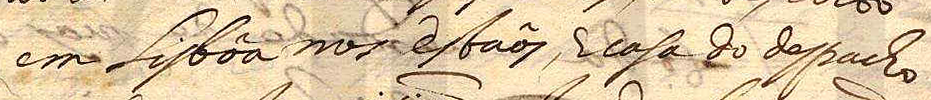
em Lisboa nos estaos, E casa do despacho
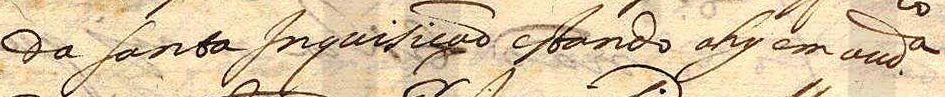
da santa Jnquisiçaõ estando ahy em auda.
